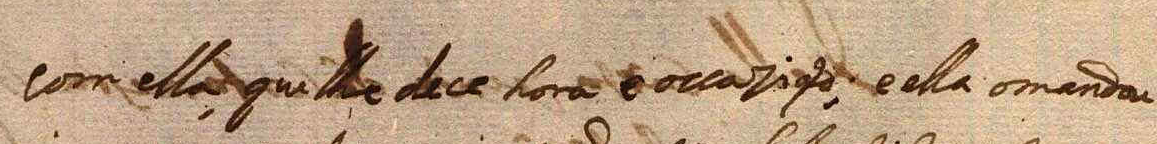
com ella, que lhe dece hora e occaziaõ, e ella o mandou
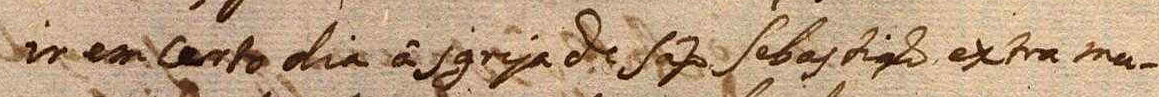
ir em certo dia á jgreja de Saõ Sebastiaõ extramu
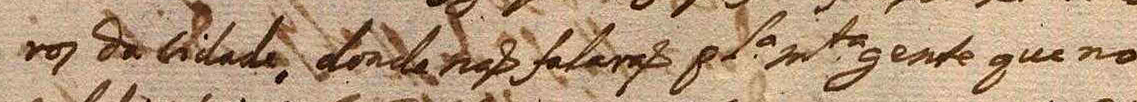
ros da cidade, donde naõ falaraõ pl.a m.ta gente que no
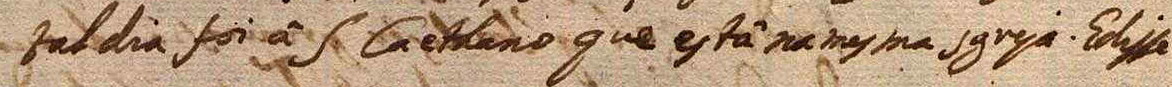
tal dia foi á S Caethano que está na mesma jgreja. E disse
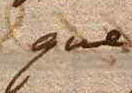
que
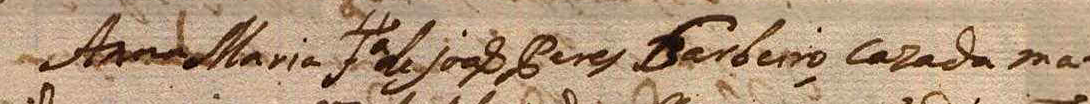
Anna Maria Fa de joaõ Peres Barbeiro, cazada ma
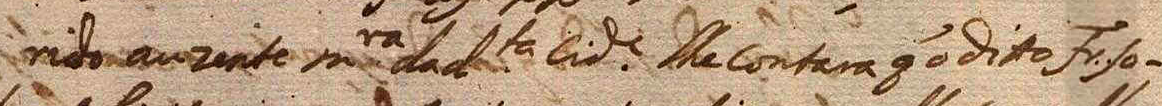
rido auzente m.ra da d.ta cid.e lhe contara q̄ o ditto Fr. jo
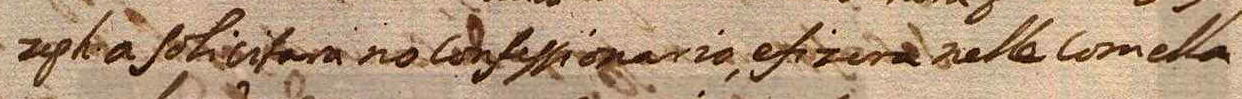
zeph a solicitara no confessionario, e fizera nelle com ella
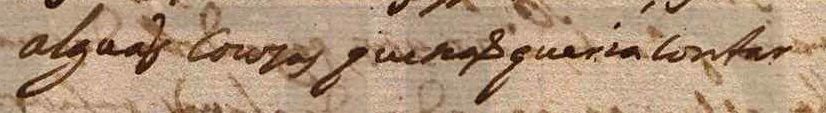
alguās couzas que naõ queria contar
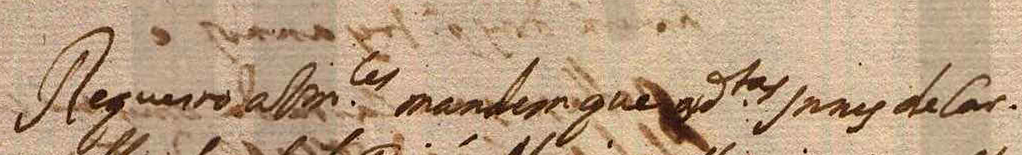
Requeiro a V m.ces mandem que as d.tas jnnes de Car
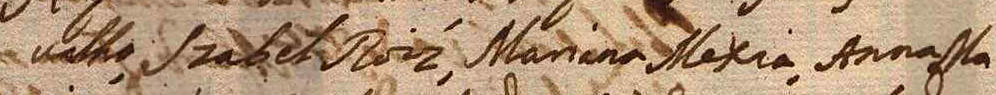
ualho, Izabel Roiz̄, Mariana Mexia Anna Ma
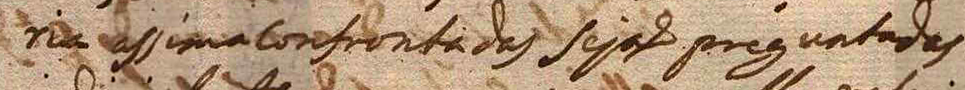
ria assima confrontadas sejaõ preguntadas
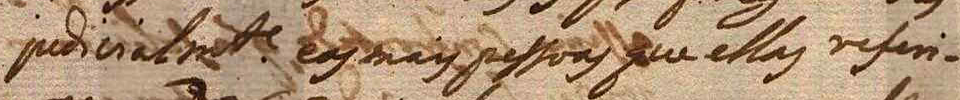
judicialmte. e as mais pessoas que ellas referi
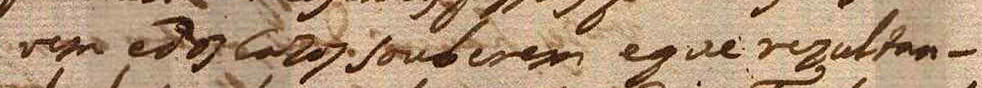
rem e dos cazos souberem e que rezultan
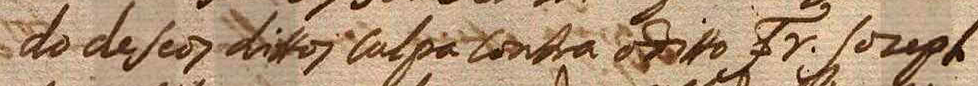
do de seos dittos culpa contra o ditto Fr. Jozeph
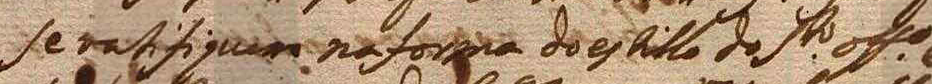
se ratifiquem na forma do estillo do S.to off.o e
